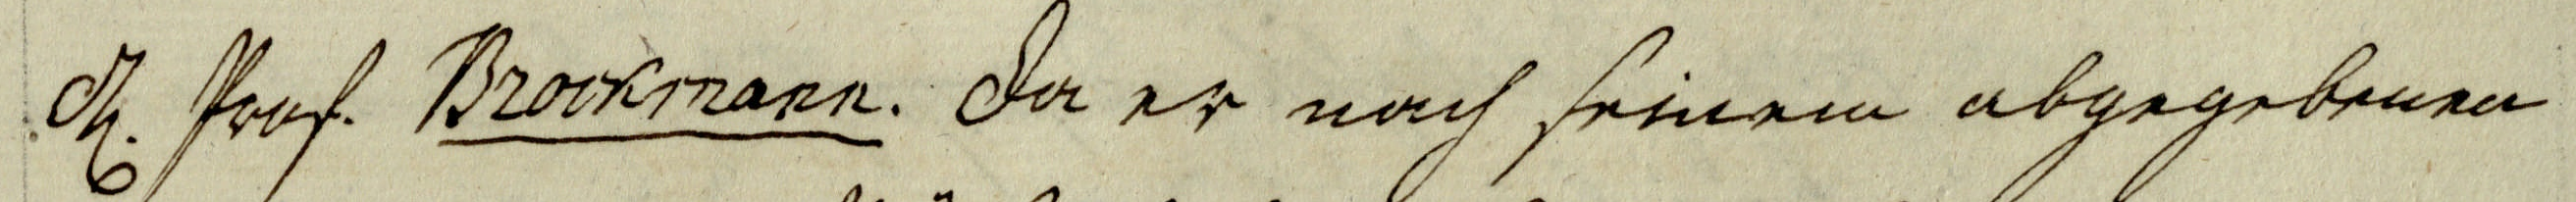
dh. Prof. Brockmann. da er nach seinem abgegebenen
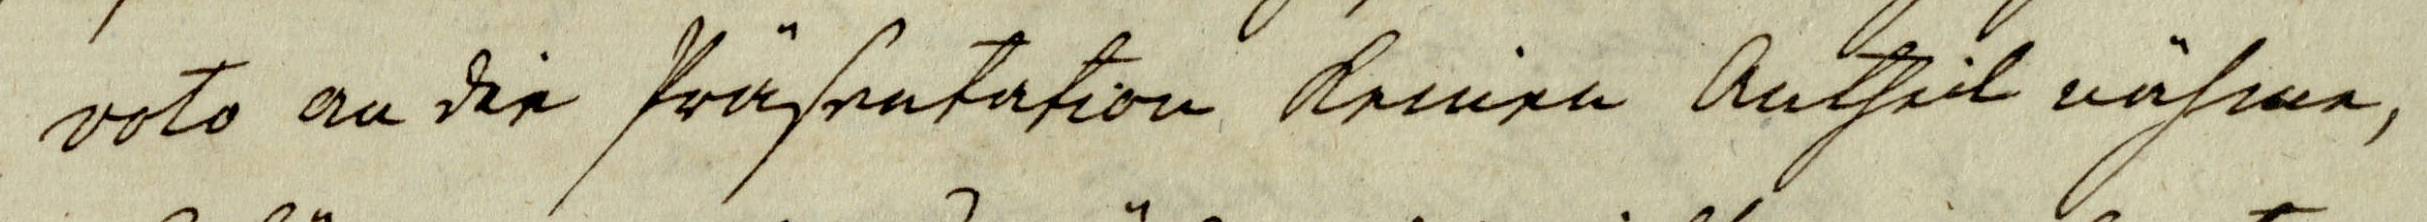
voto an der Präsentation keinen Antheil nähme,
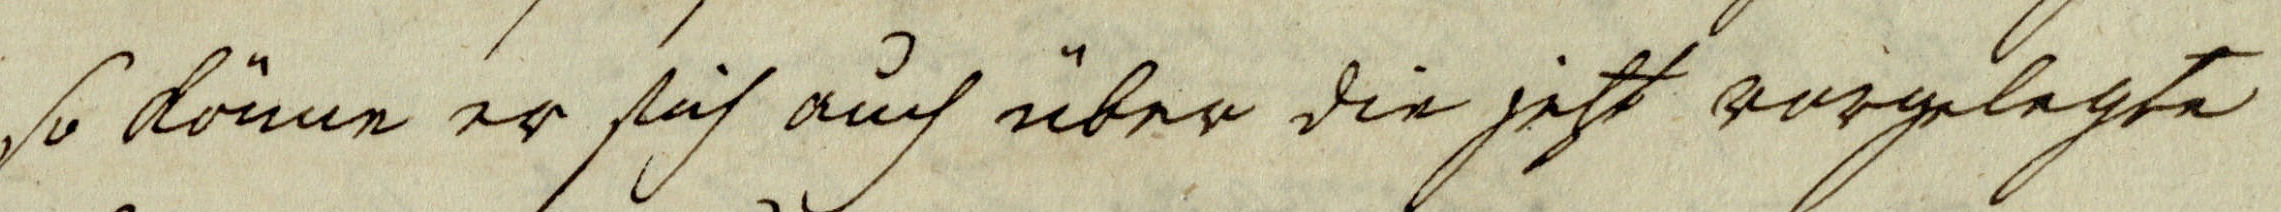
so könne er sich auch über die jetzt vorgelegte
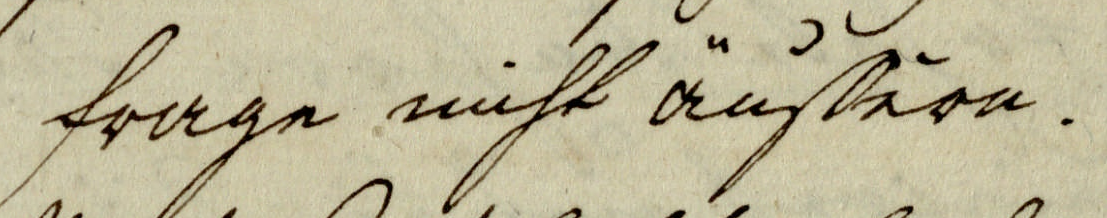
Frage nicht äussern.
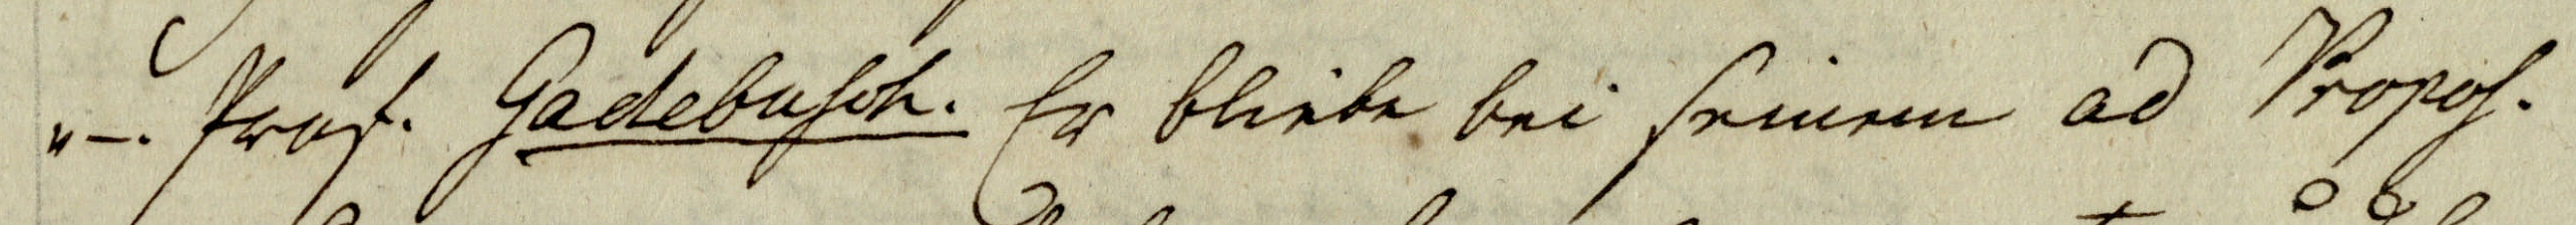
" — . Prof. Gadebusch. Er bleibe bei seinem ad Propos.
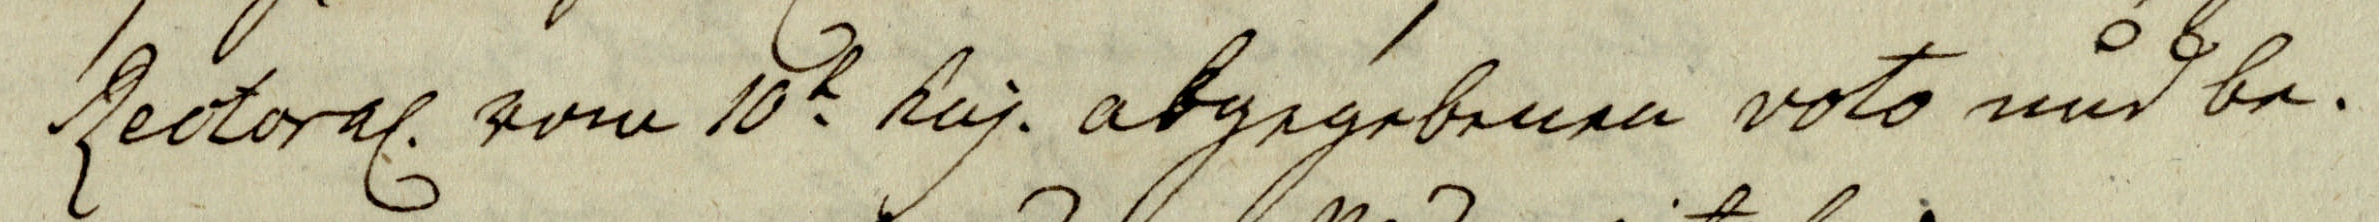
Rectoral. vom 10t. huj. abgegebenen voto und be¬
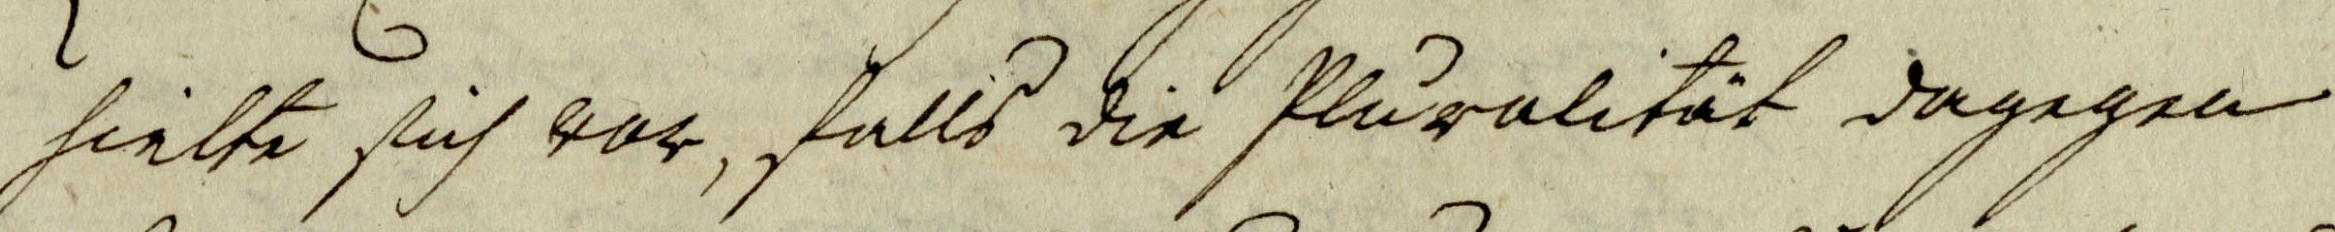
hielte sich vor, falls die Pluralität dagegen
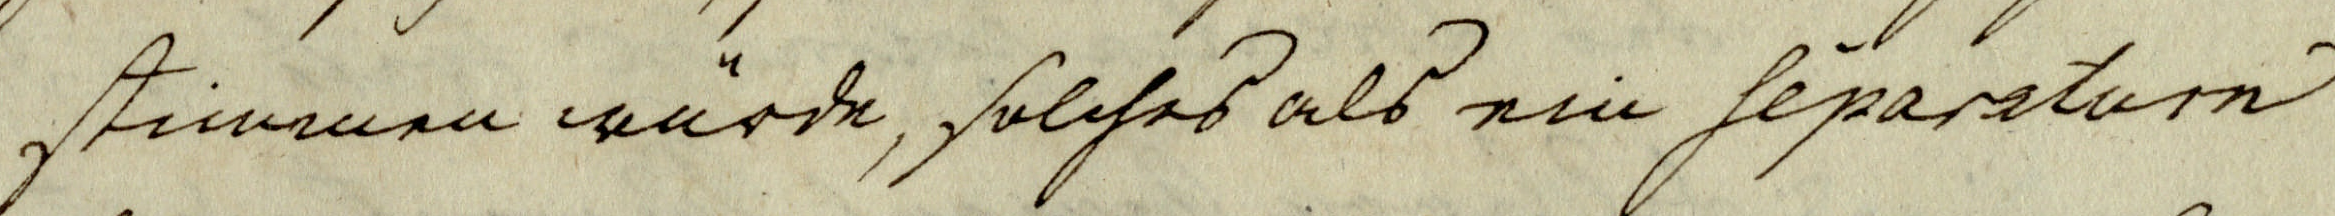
stimmen würde, solches als ein separatum
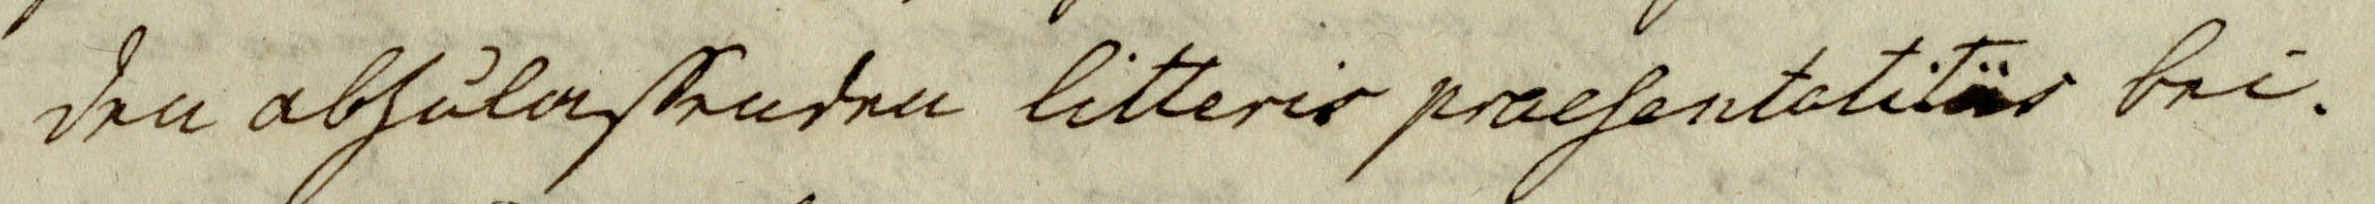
den abzulassenden litteris praesentatitiis bei¬
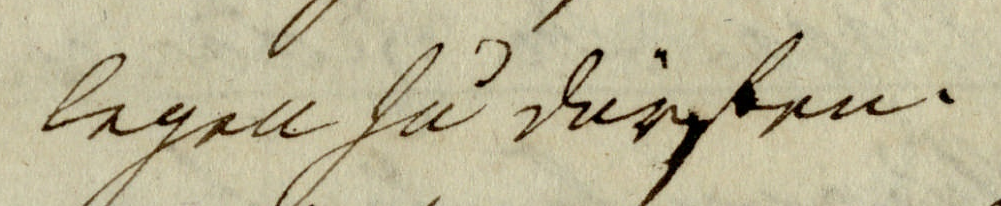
legen zu dürfen.
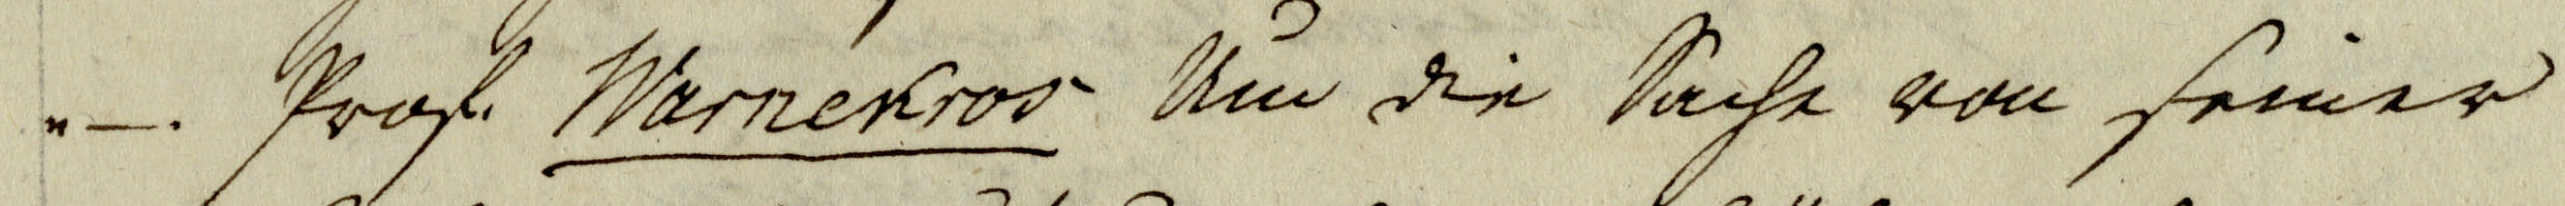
" — . Prof. Warneckros Um die Sache von seiner
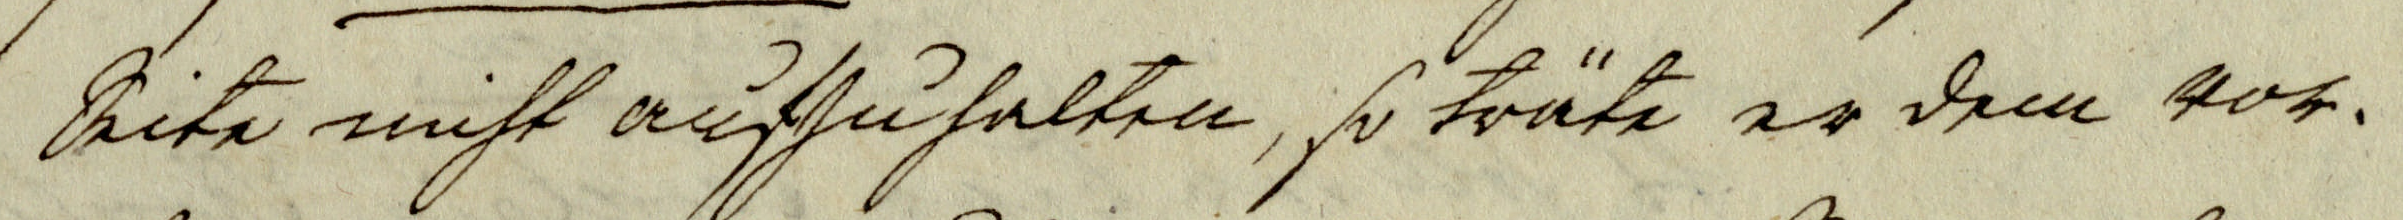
Seite nicht aufzuhalten, so träte er dem vor¬
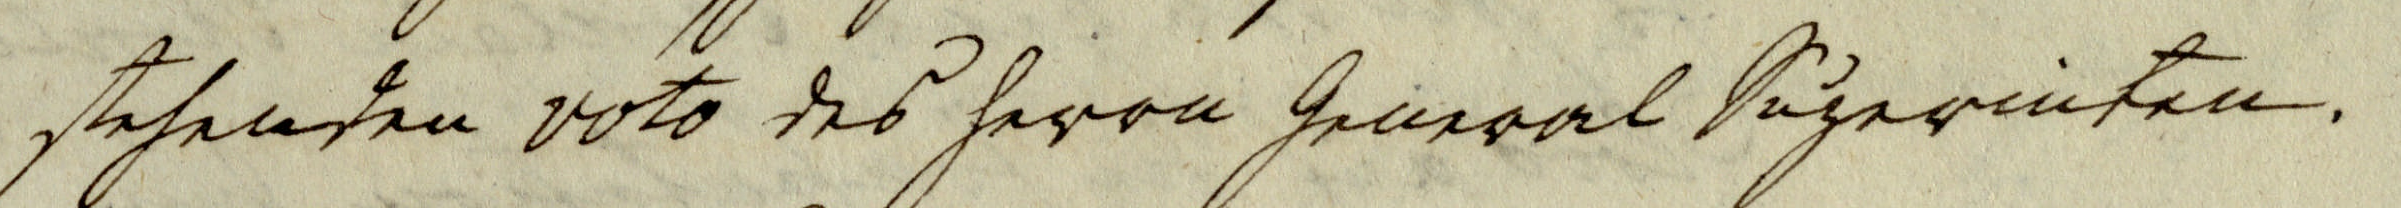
stehenden voto des Herrn General Superinten¬
